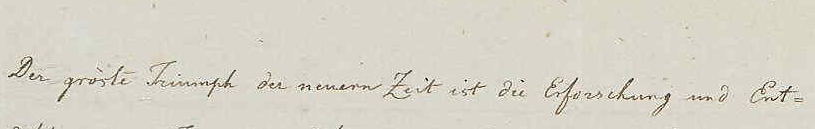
Der gröste Triumph der neuern Zeit ist die Erforschung und Ent-
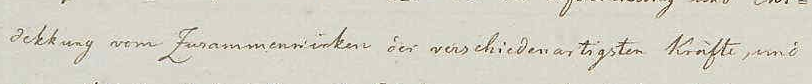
dekkung vom Zusammenwirken der verschiedenartigsten Kräfte und
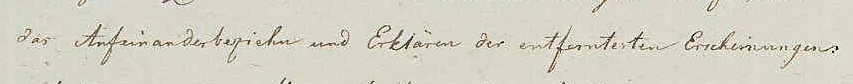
das Aufeinanderbeziehn und Erklären der entferntesten Erscheinungen:
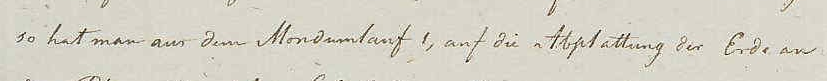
so hat man aus dem Mondumlauf 1, auf die Abplattung der Erde an
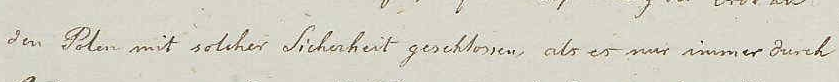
den Polen mit solcher Sicherheit geschlossen, als es nur immer durch
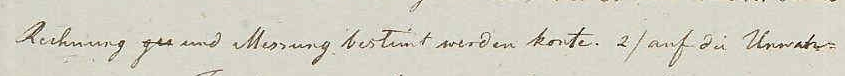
Rechnung ges und Messung bestimt werden konte. 2) auf die Unwahn-
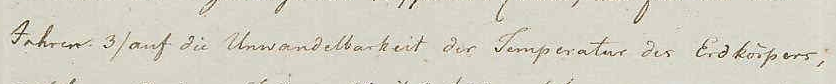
Jahren. 3) auf die Unwandelbarkeit der Temperatur des Erdkörpers,
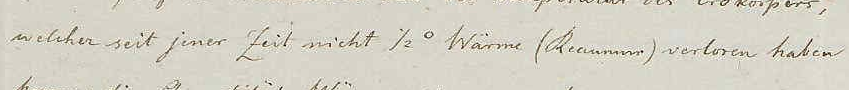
welcher seit jener Zeit nicht ½° Wärme verloren haben
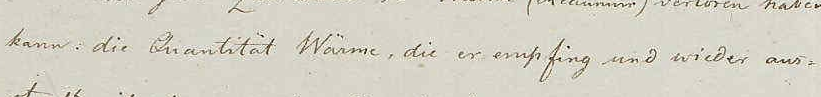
kann: die Quantität Wärme, die er empfing und wieder aus-
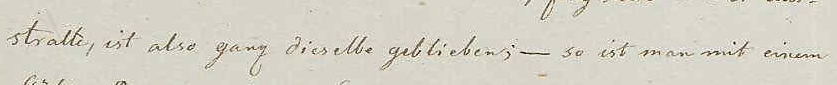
stralte, ist also ganz dieselbe geblieben; – so ist man mit einem
